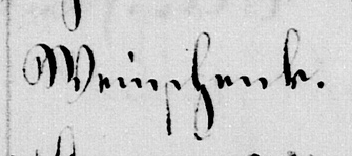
Weinschenk.
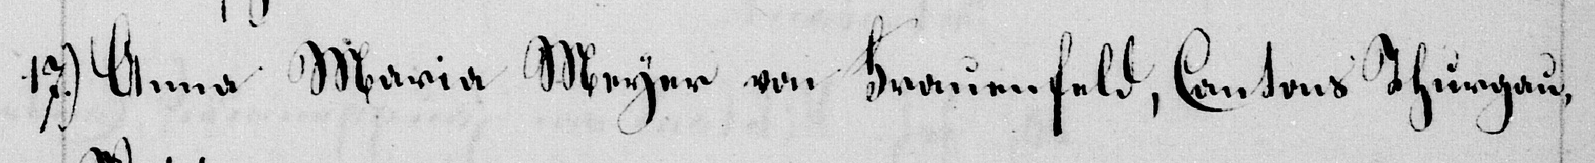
17.) Anna Maria Meyer von Frauenfeld, Cantons Thurgau,
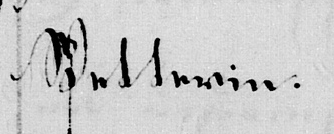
Spetterin.
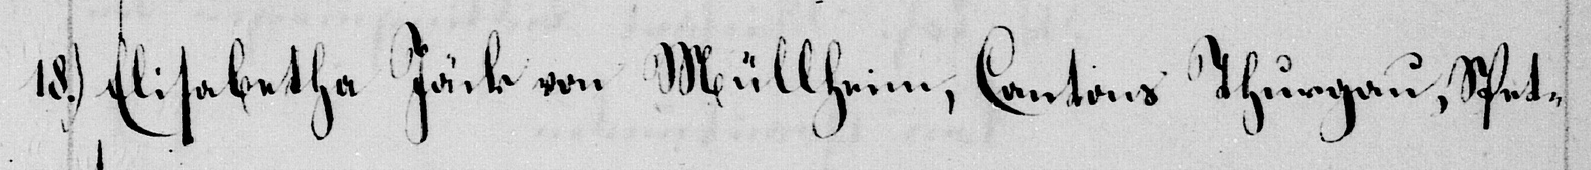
18.) Elisabetha Jäck von Müllheim, Cantons Thurgau, Spet¬
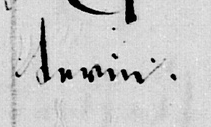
terin.
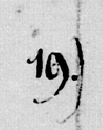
19.)
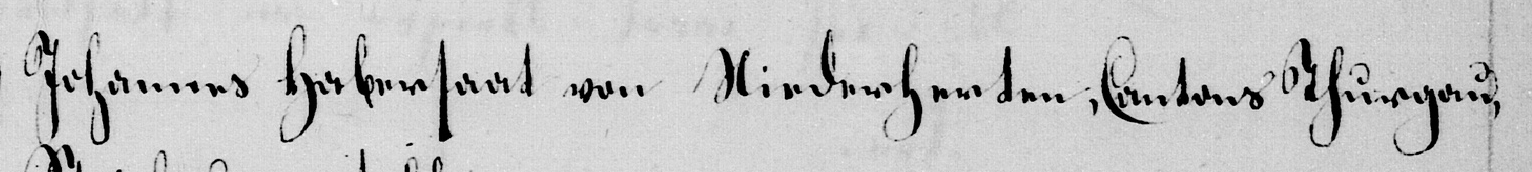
Johannes Habersaat von Niederherten, Cantons Thurgau,
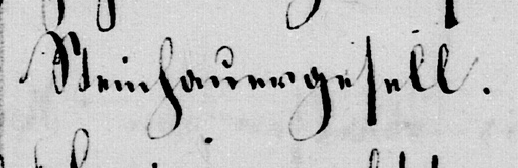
Steinhauergesell.
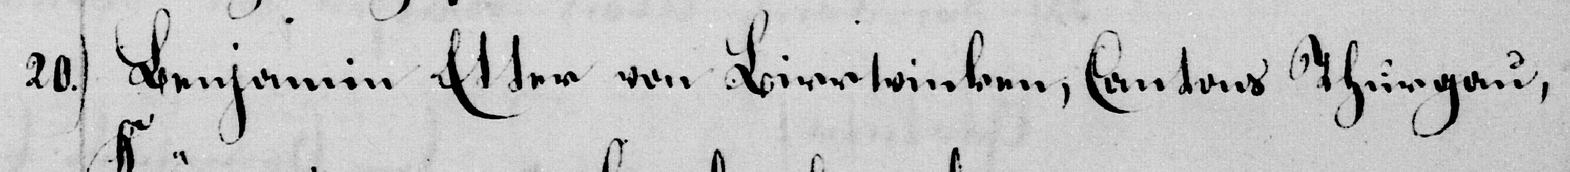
20.) Benjamin Etter von Birrwinken, Cantons Thurgau,
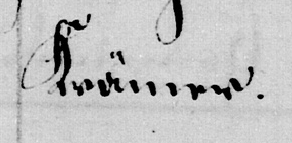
Krämer.
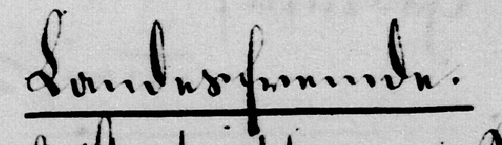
Landesfremde.
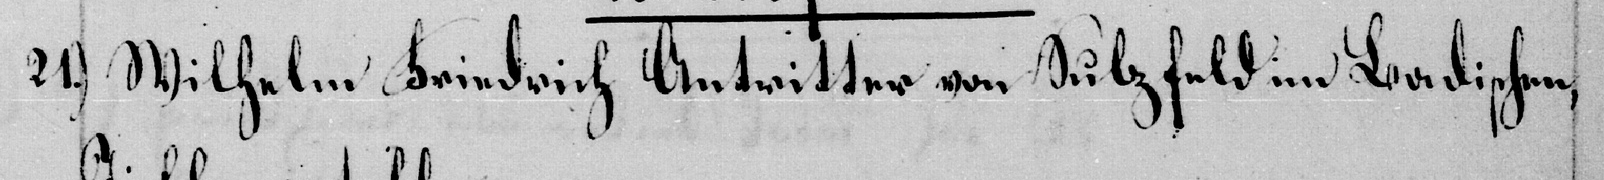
21.) Wilhelm Friedrich Antritter von Sulzfeld im Badischen,
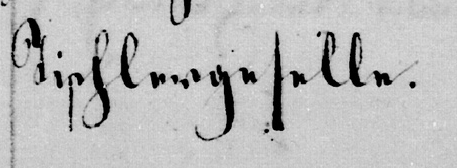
Tischlergeselle.
